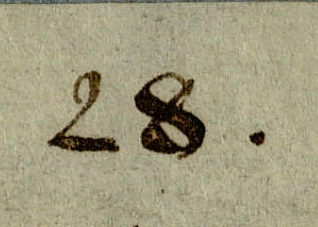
28.
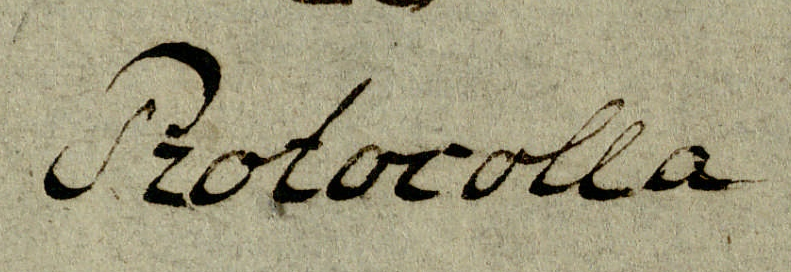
Protocolla
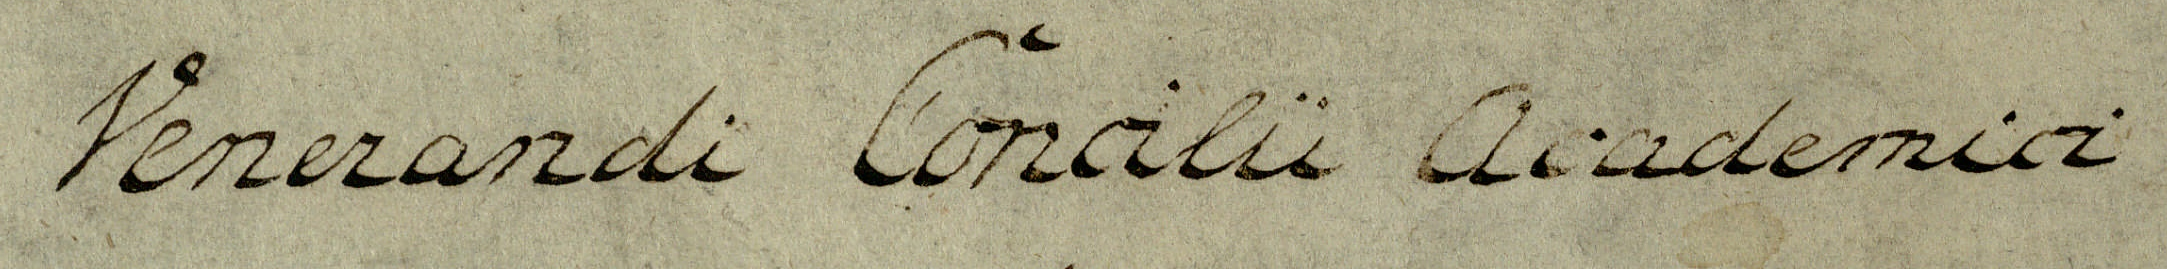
Venerandi Concilii Academici
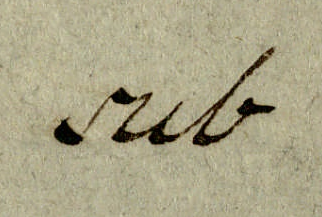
sub
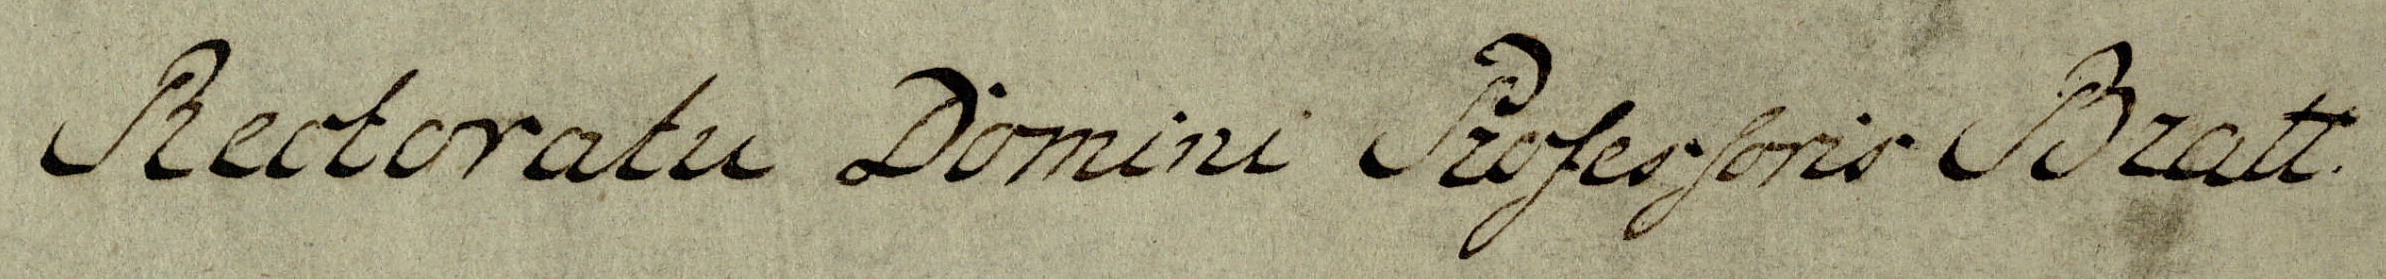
Rectoratu Domini Professoris Bratt.
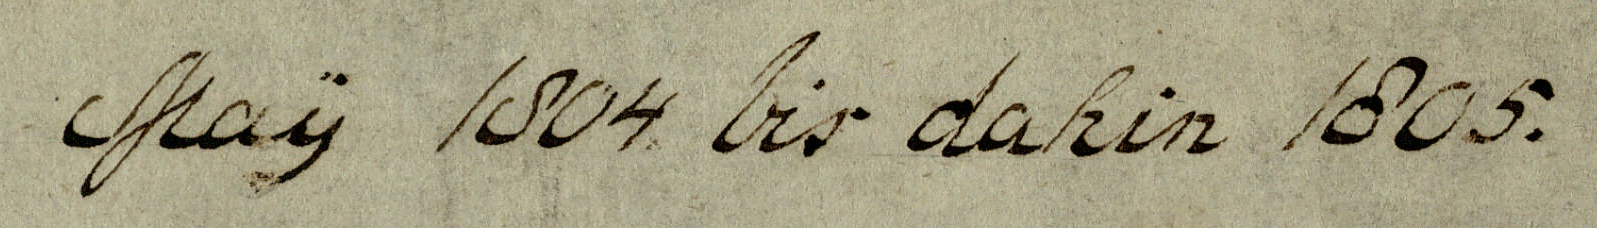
Maÿ 1804. bis dahin 1805.
